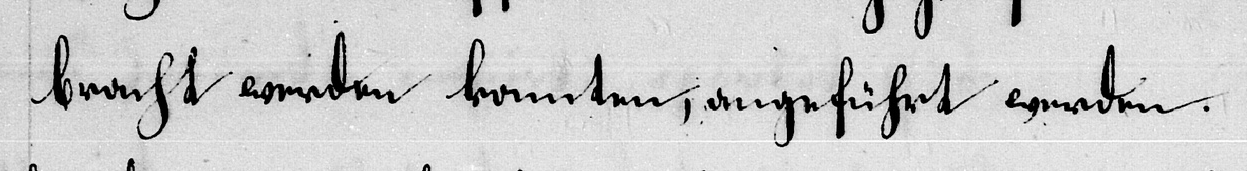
bracht werden konnten, angeführt werden.
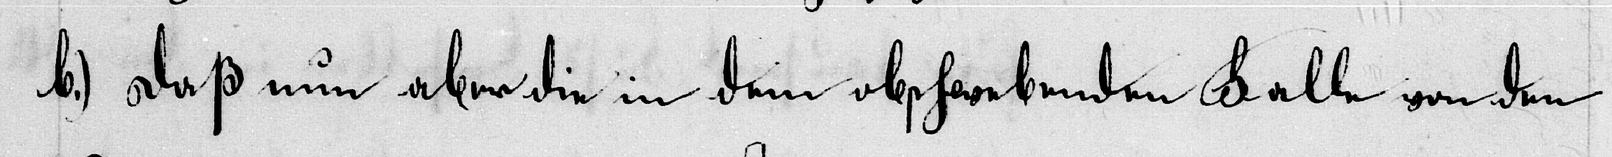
b.) Daß nun aber die in dem obschwebenden Falle von den
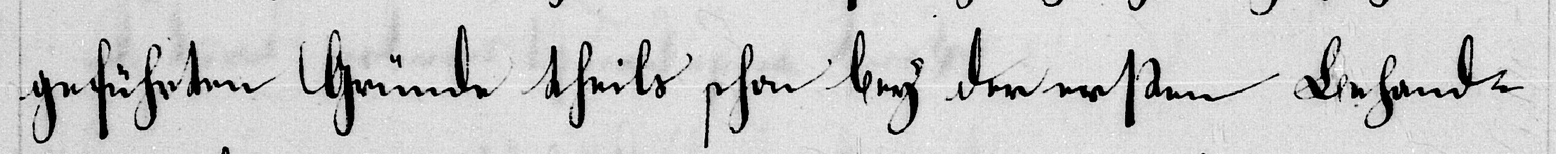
geführten Gründe theils schon bey der ersten Behand¬
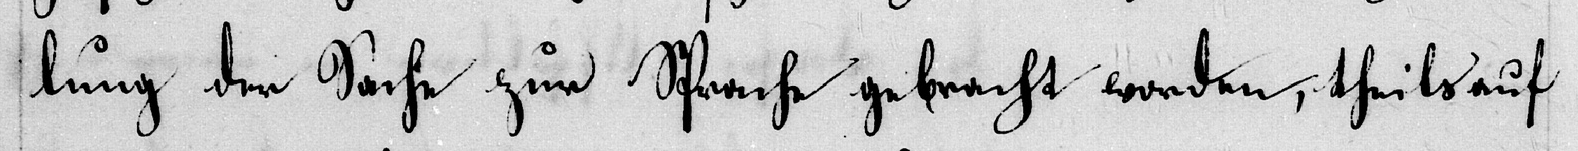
lung der Sache zur Sprache gebracht worden, theils auf
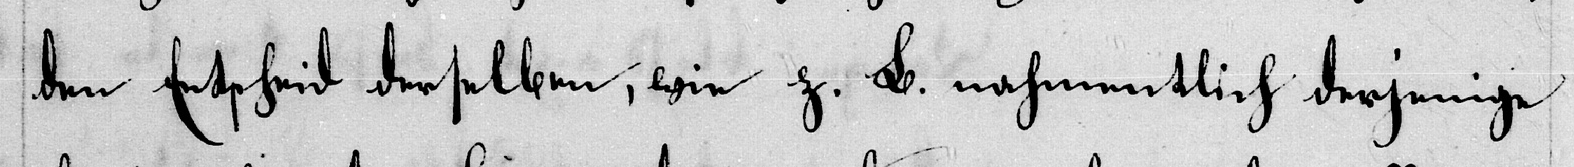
den Entscheid derselben, wie z.B. nahmentlich derjenige
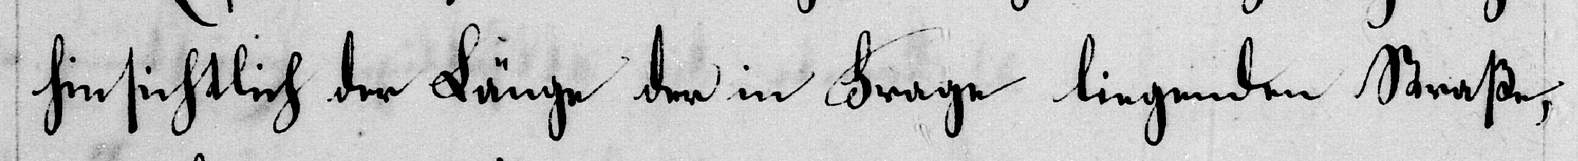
hinsichtlich der Länge der in Frage liegenden Straße,
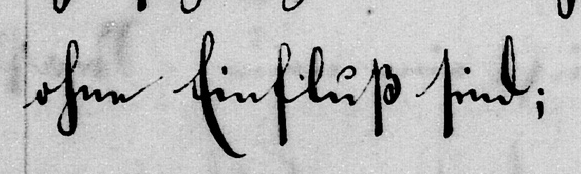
ohne Einfluß sind;
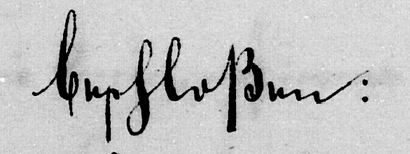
beschloßen:
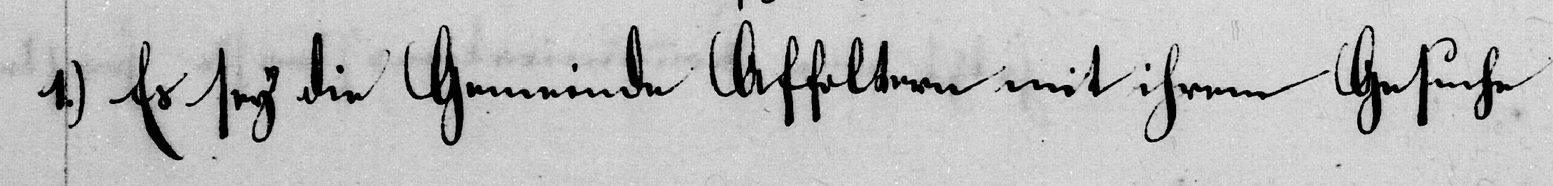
1.) Es sey die Gemeinde Affoltern mit ihrem Gesuche
